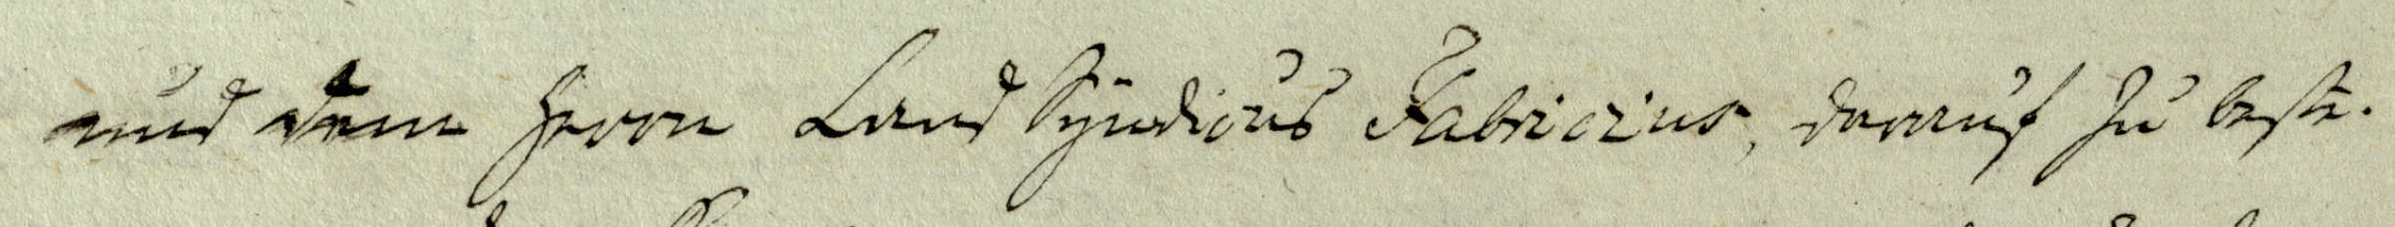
und dem Herrn Land Sÿndicus Frabricius, darauf zu beste¬
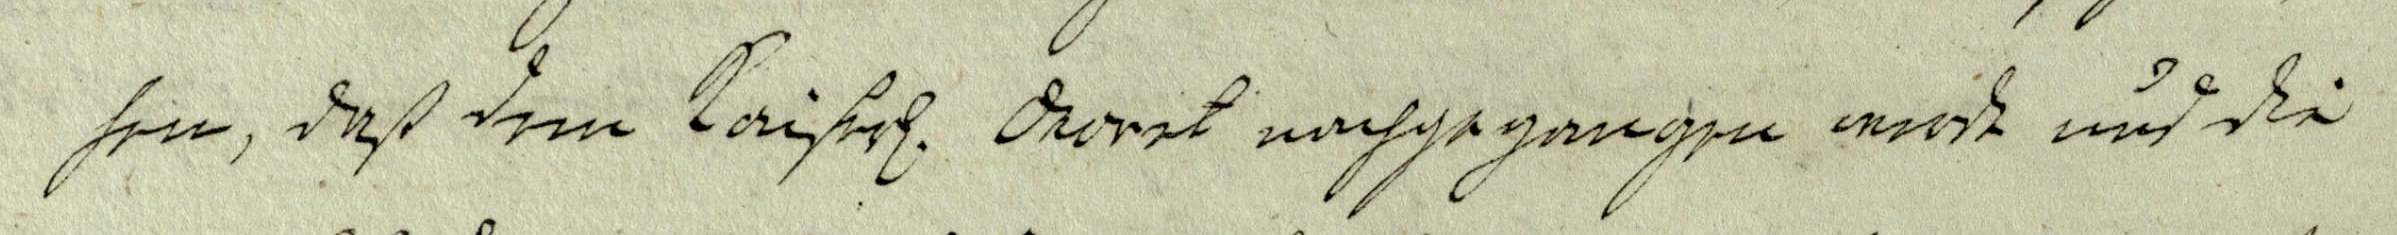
hen, daß dem Kaiserl. Decret nachgegangen werde und die
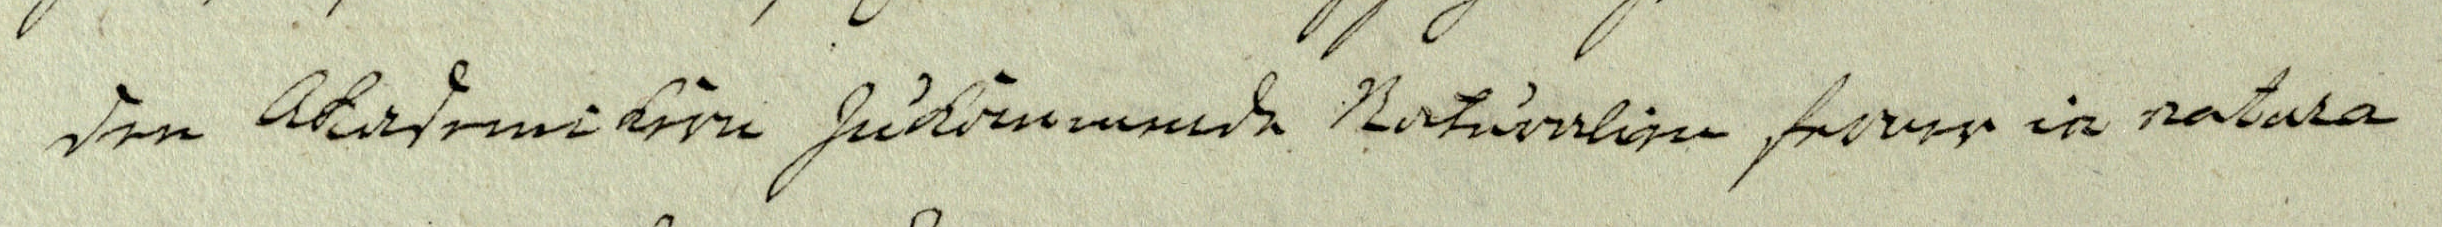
den Akademikern zukommende Naturalien ferner in natura
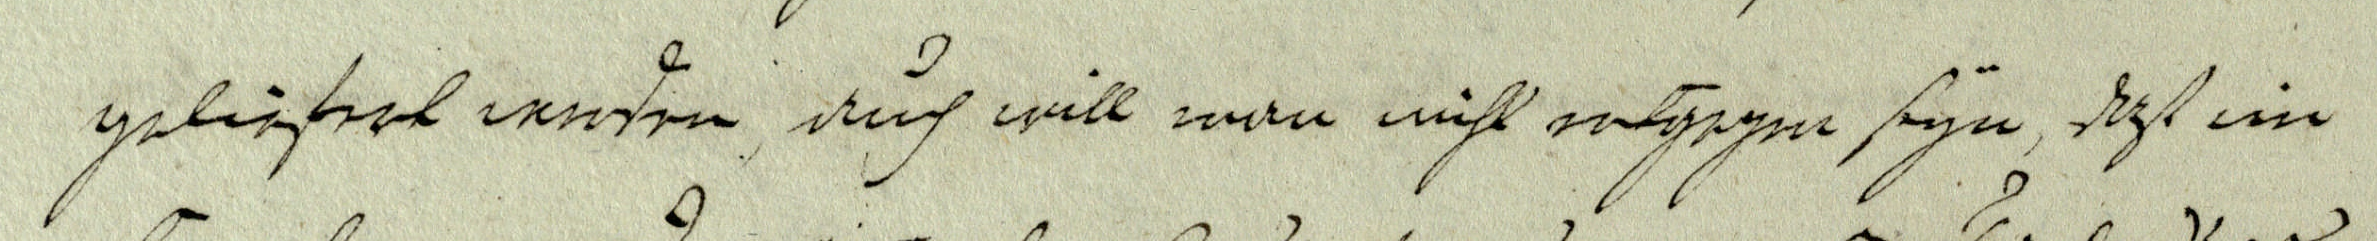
geliefert werden auch will man nicht entgegen seÿn, daß im
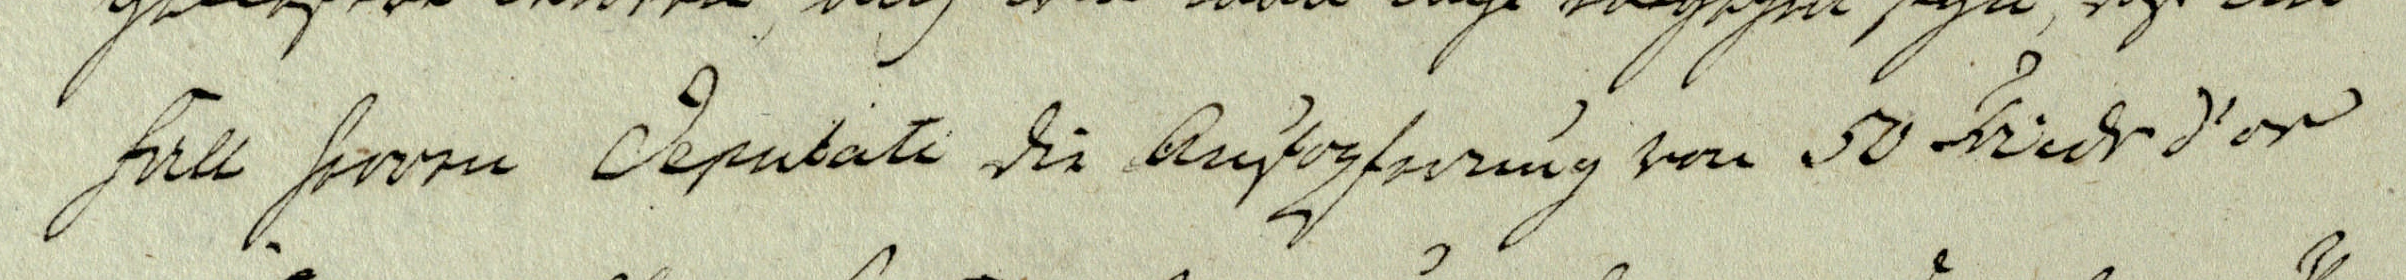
Fall Herren Deputati die Aufopferung von 50 Friedr ď or
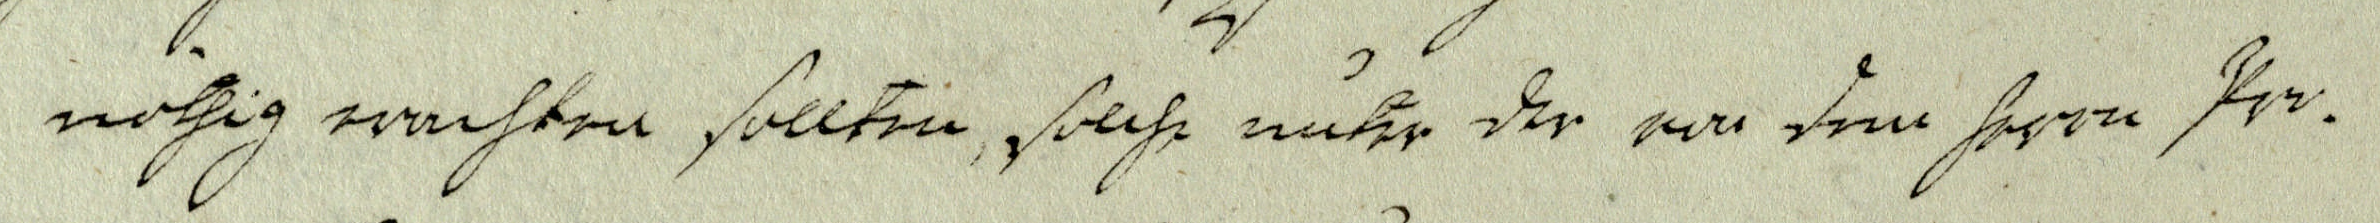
nöthig erachten sollten, solche unter der von dem Herrn Pro¬
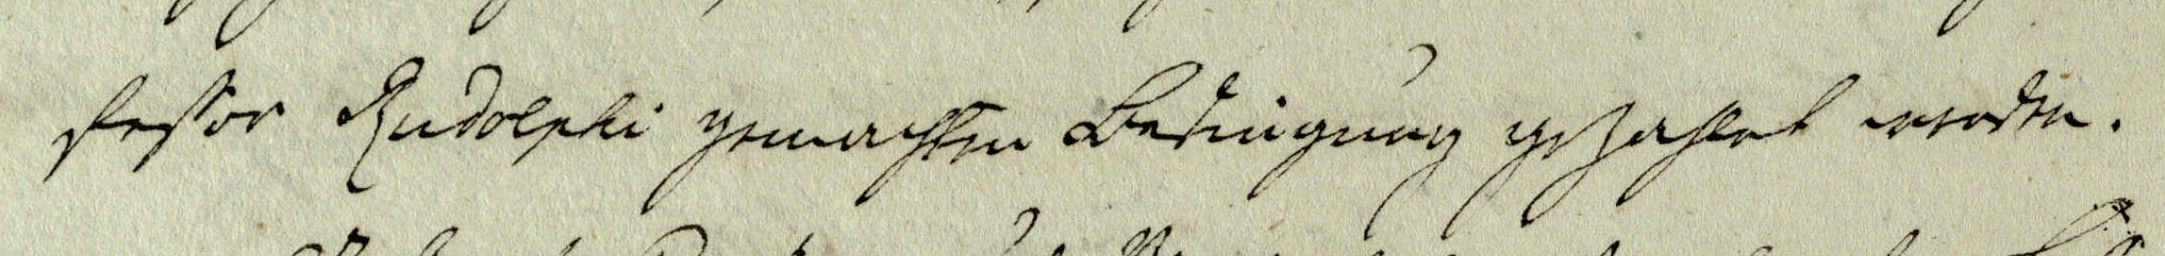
fessor Rudolphi gemachten Bedingung gezahlet werden.
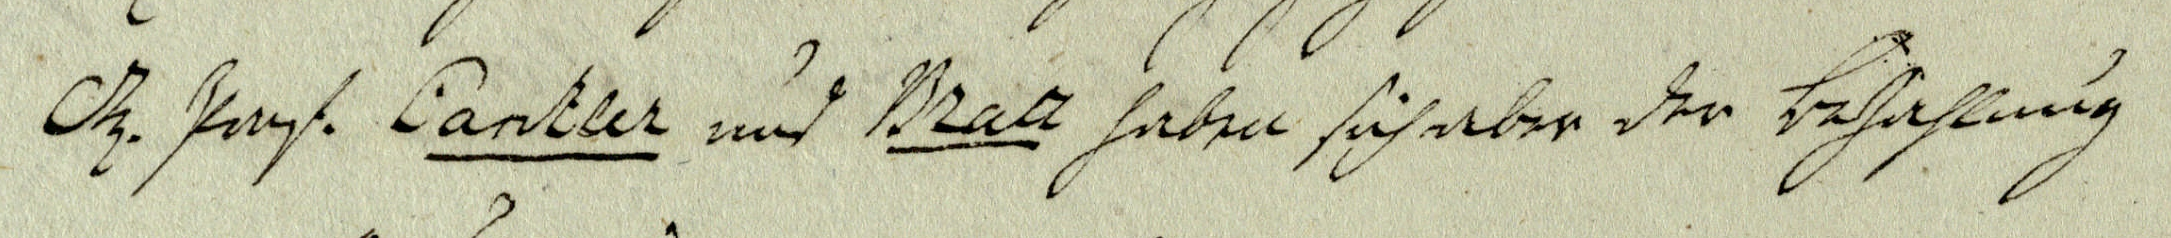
dh. Prof. Canzler und Bratt haben sich aber der Bezahlung
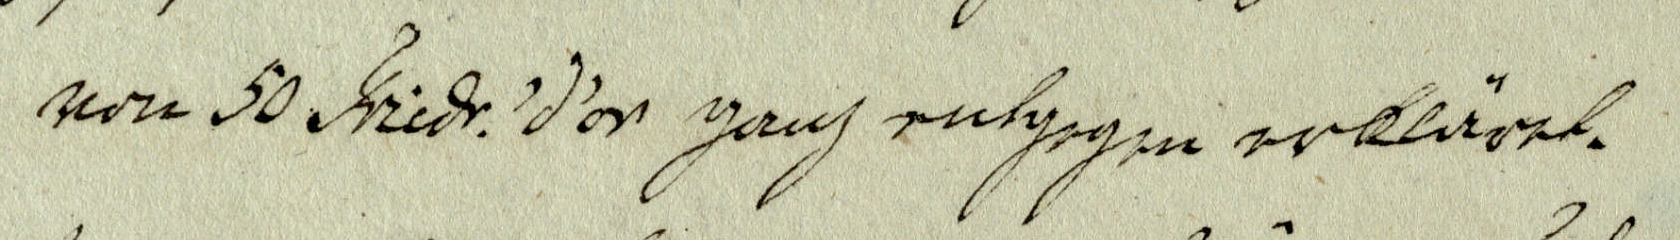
von 50 Friedr d' ganz entgegen erkläret.
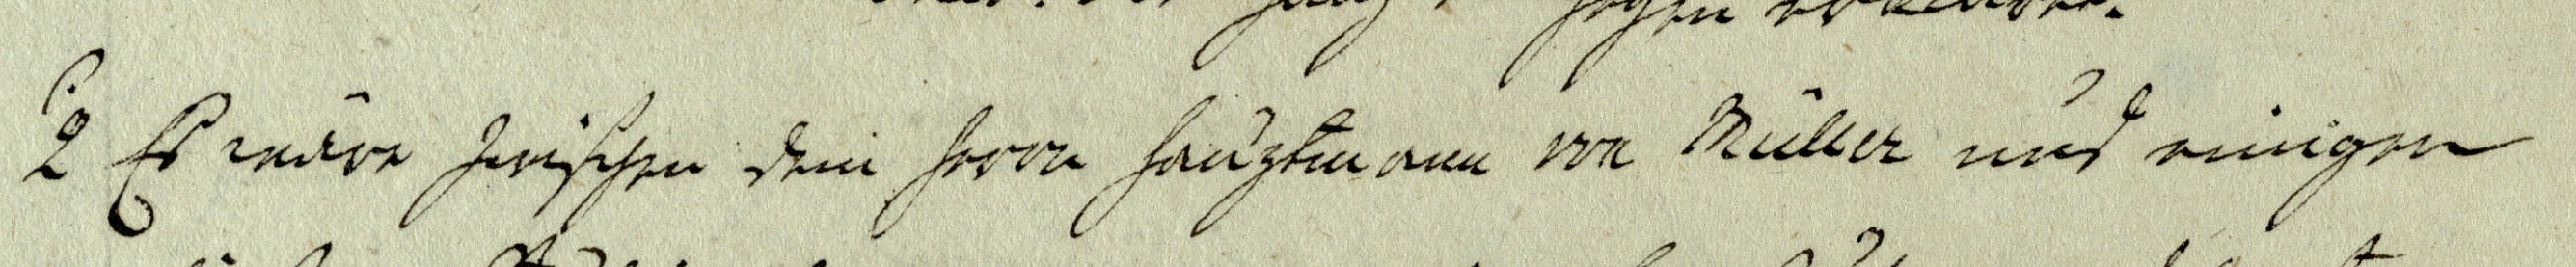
2. Es wäre zwischen dem Herrn Hauptmann von Müller und einigen
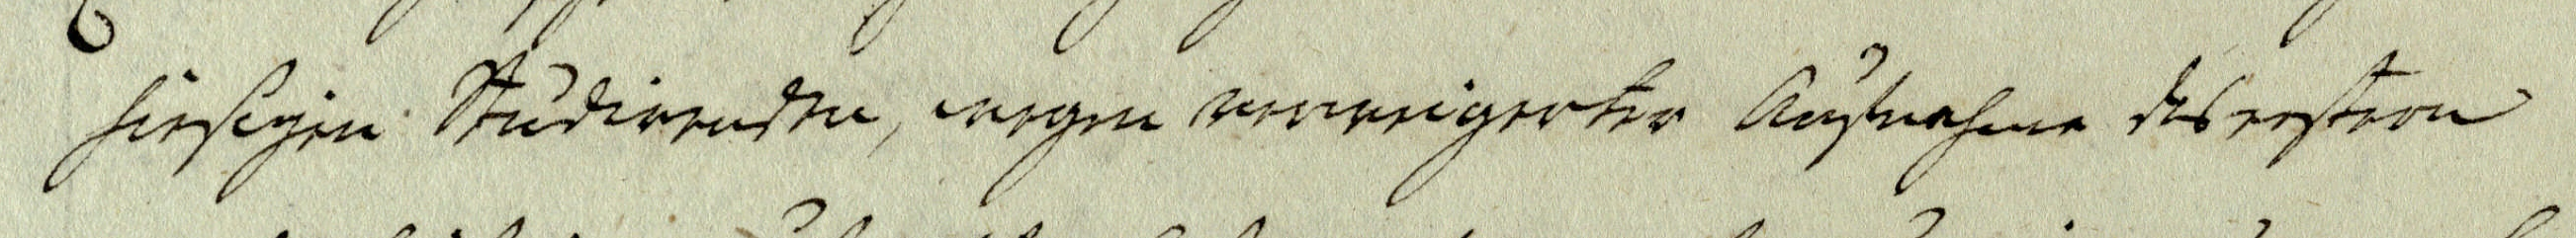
hiesigen Studirenden, wegen verweigerter Aufnahme des erstern
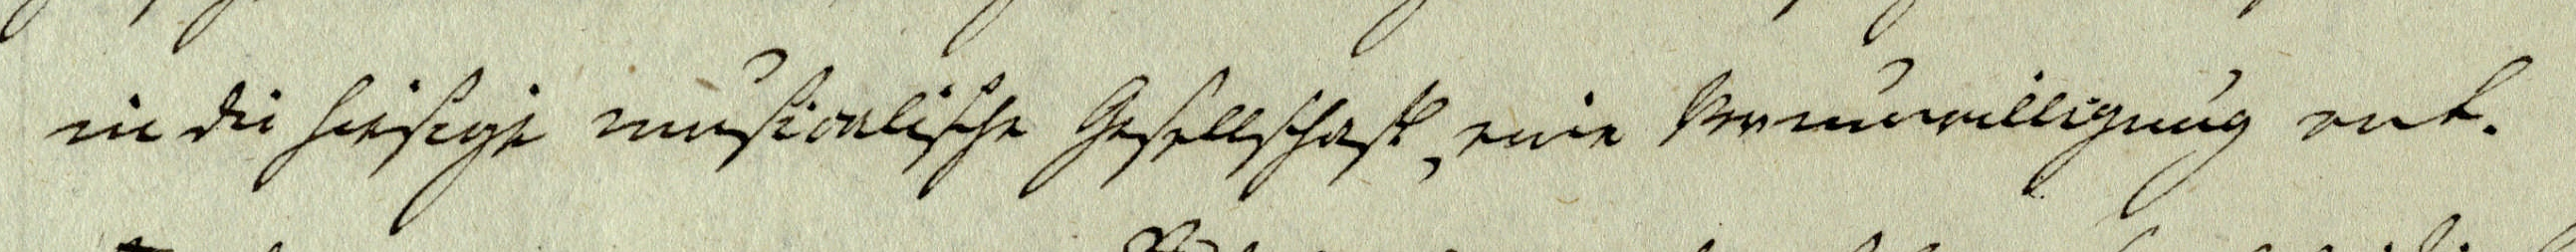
in die hiesige musicalische Gesellschaft, eine Verunwilligung ent¬
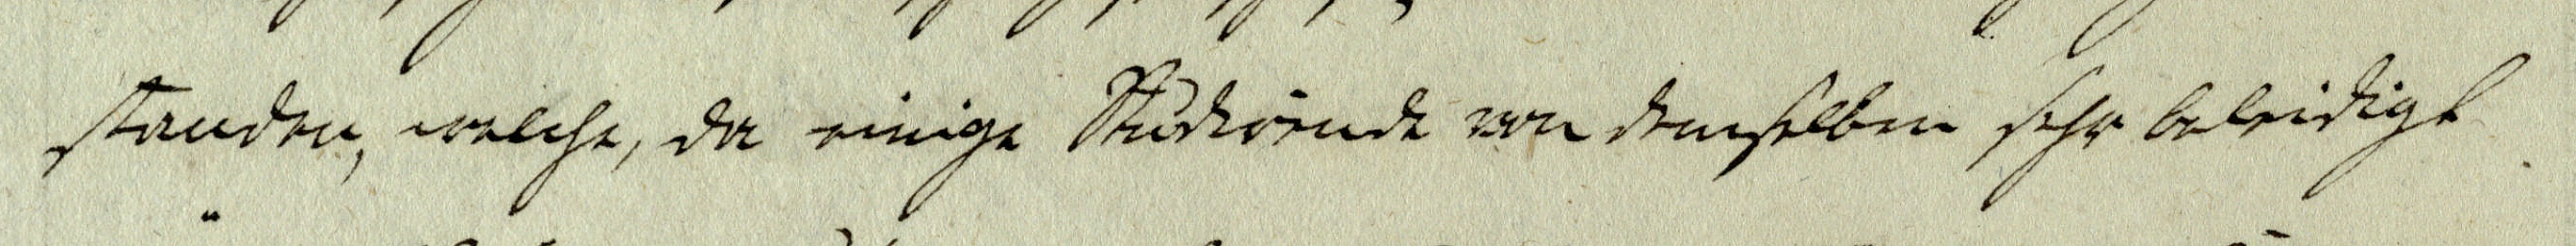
standen, welche, da einige Studirende von demselben sehr beleidigt
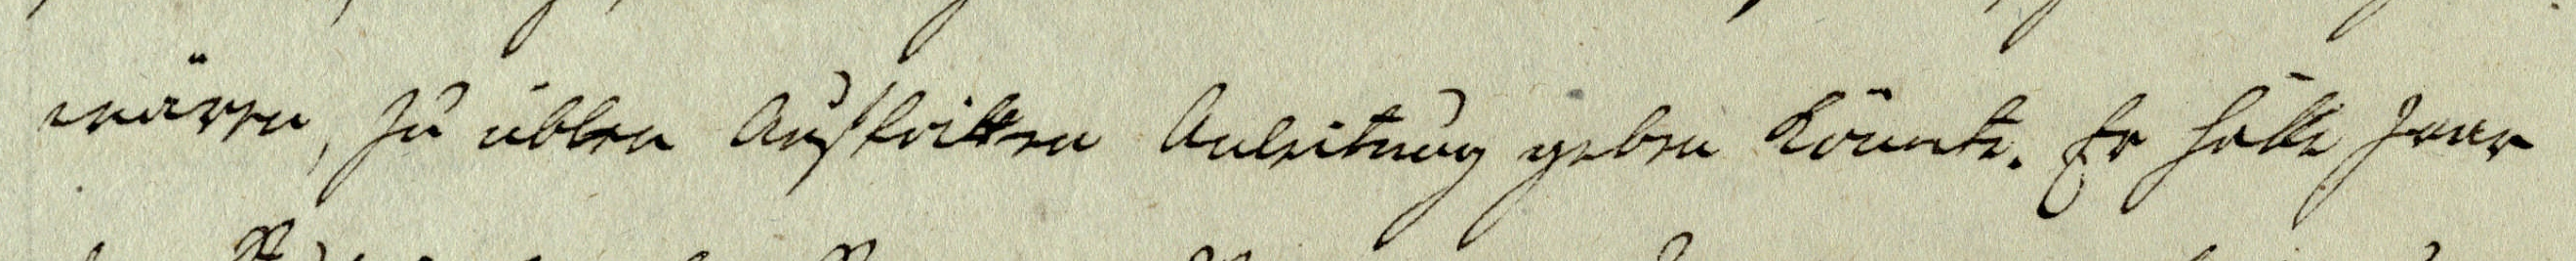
wären, zu üblen Auftritten Anleitung geben könnte. Er hätte zwar
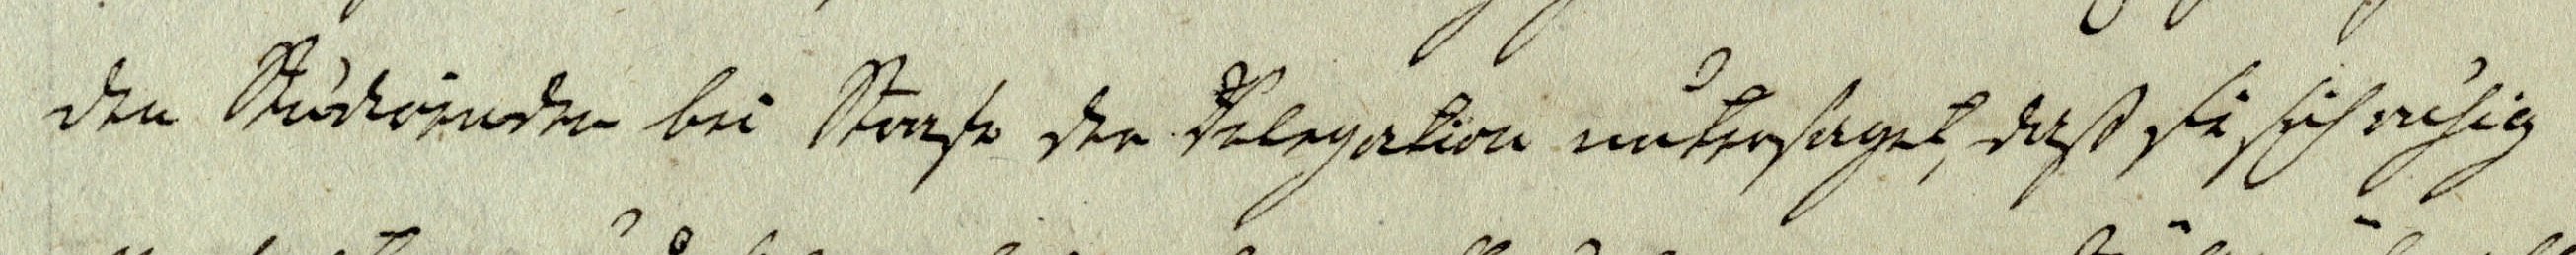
den Studirenden bei Strafe der Relegation untersaget, daß sie sich ruhig
